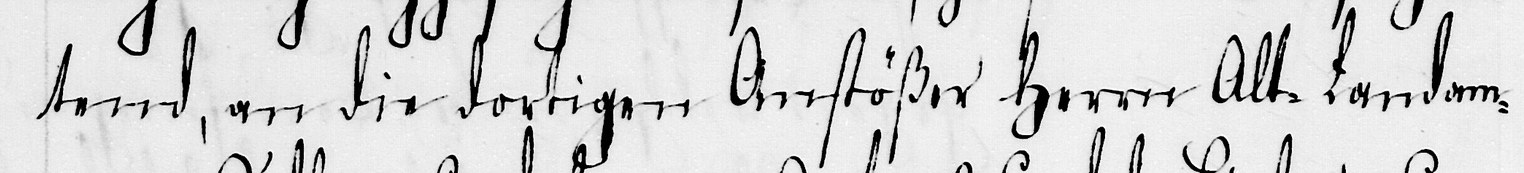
tend, an die dortigen Anstößer Herrn Alt-Landam¬
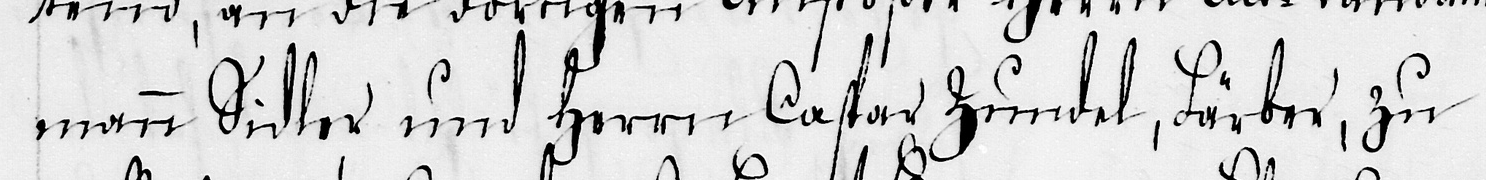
mann Sidler und Herrn Caspar Zundel, Färber, zu
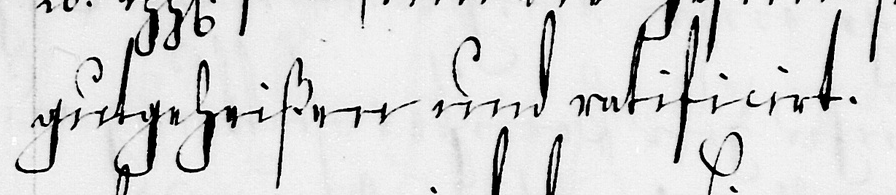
gutgeheißen und ratificirt.
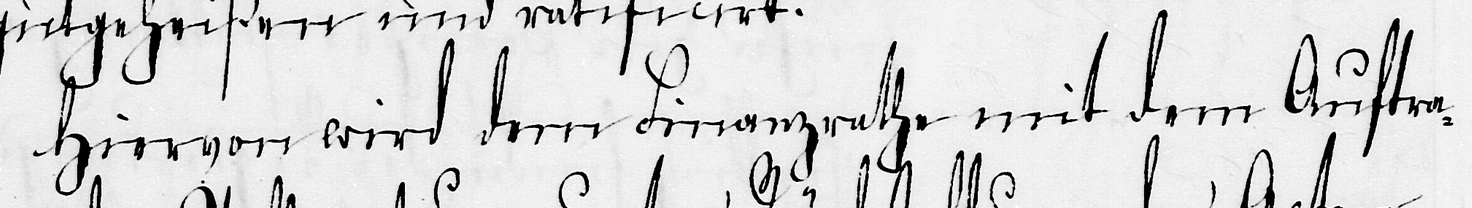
Hiervon wird dem Finanzrathe mit dem Auftra¬
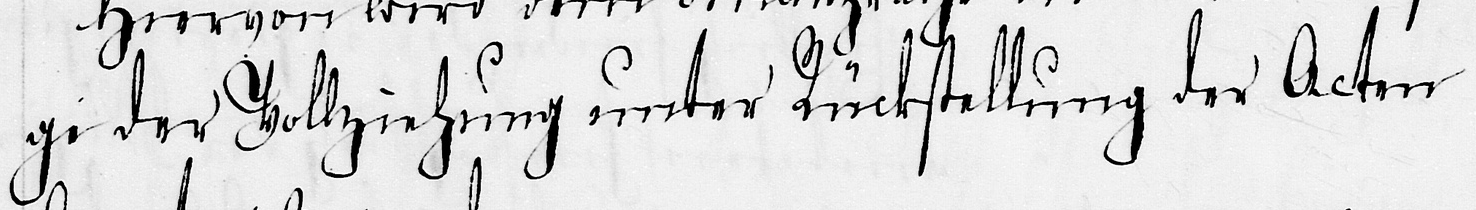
ge der Vollziehung unter Rückstellung der Acten
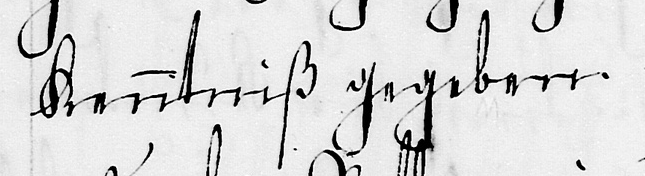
Kenntniß gegeben.
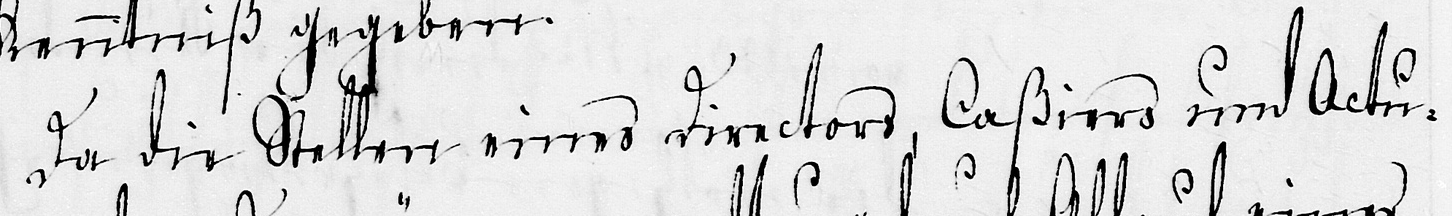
Da die Stellen eines Directors, Caßiers und Actu¬
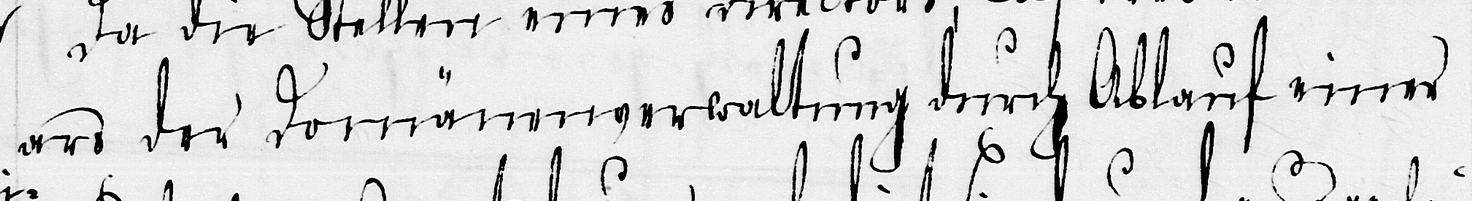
ars der Domänenverwaltung durch Ablauf einer
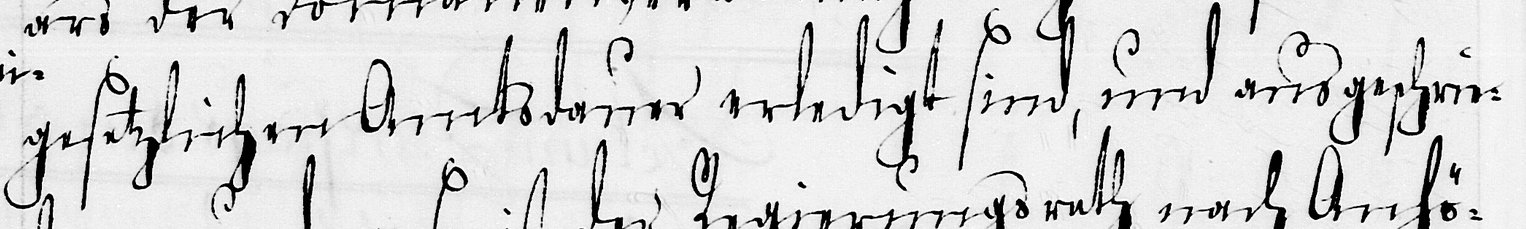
gesetzlichen Amtsdauer erledigt sind, und ausgeschrie¬
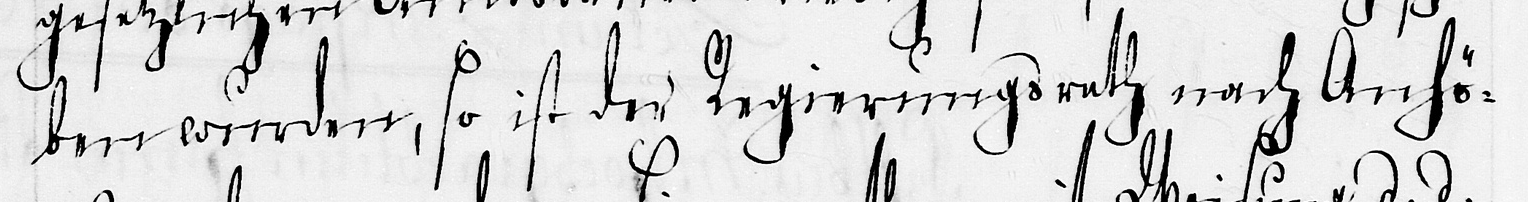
ben wurden, so ist der Regierungsrath nach Anhö¬
